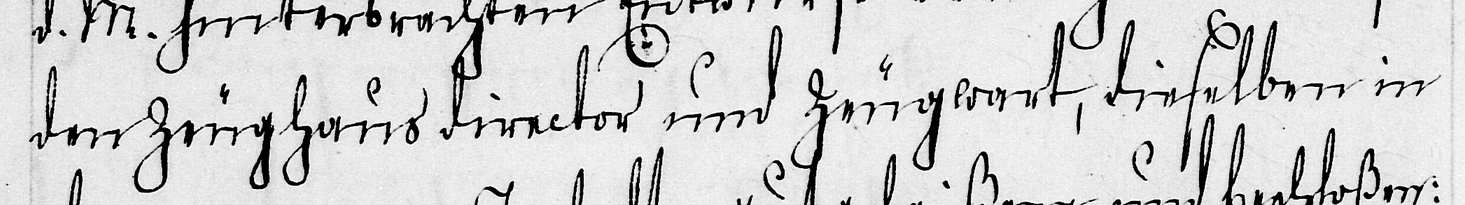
den Zeughausdirector und Zeugwart, dieselben in
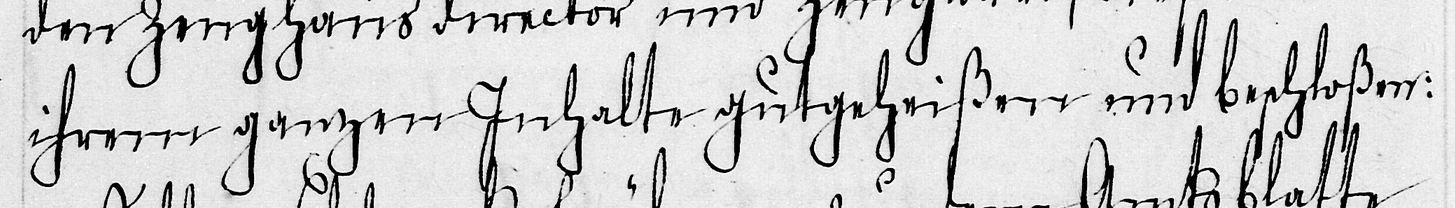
ihrem ganzen Inhalte gutgeheißen und beschloßen:
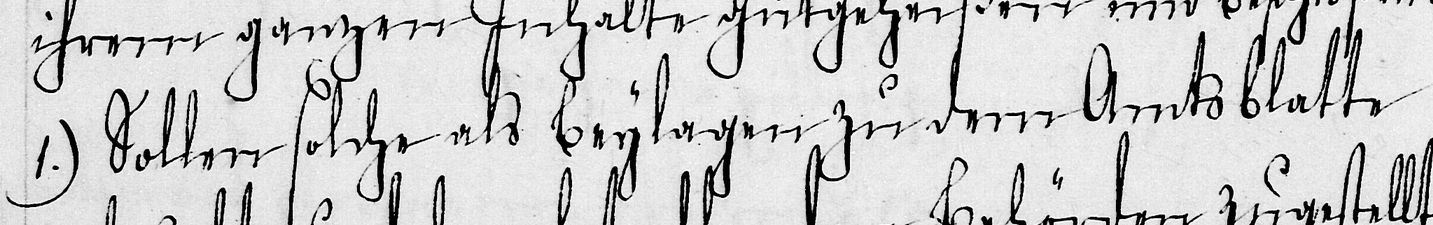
1.) Sollen solche als Beylagen zu dem Amtsblatte
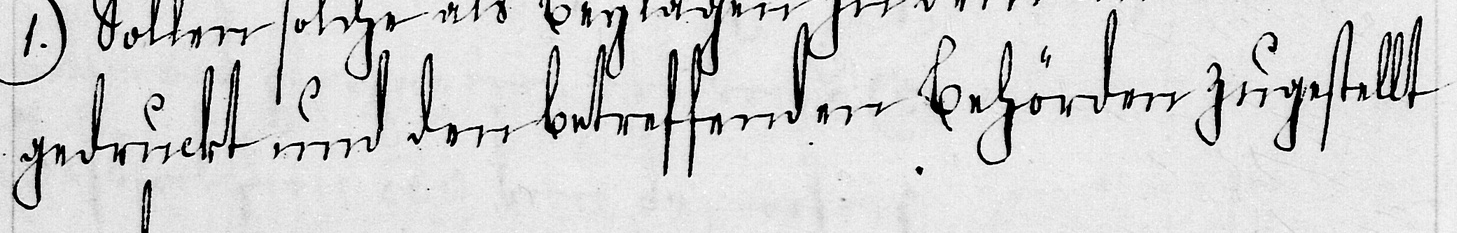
gedruckt und den betreffenden Behörden zugestellt
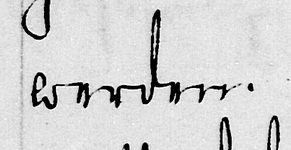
werden.
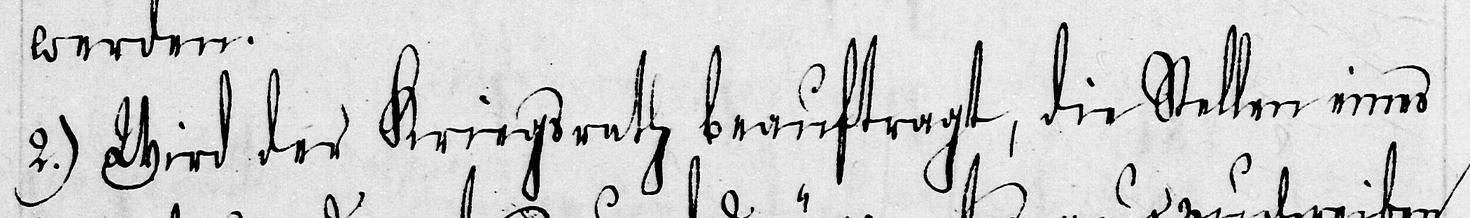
2.) Wird der Kriegsrath beauftragt, die Stellen eines
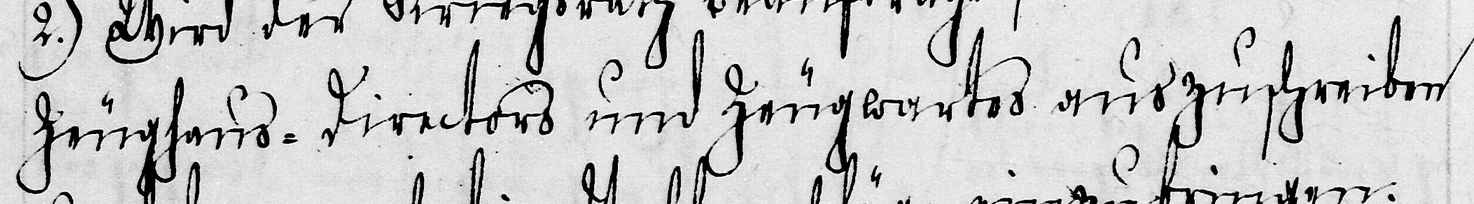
Zeughaus-Directors und Zeugwartes auszuschreiben
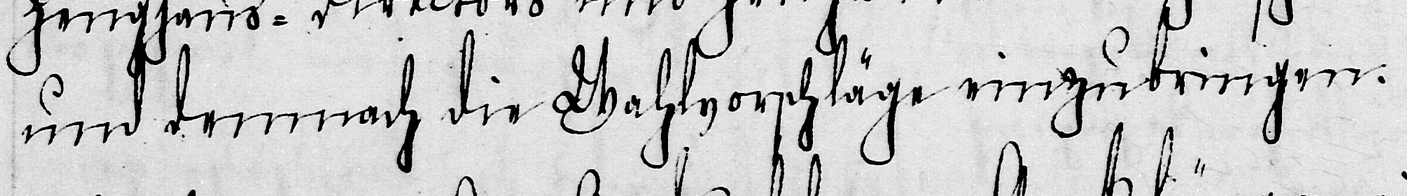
und demnach die Wahlvorschläge einzubringen.
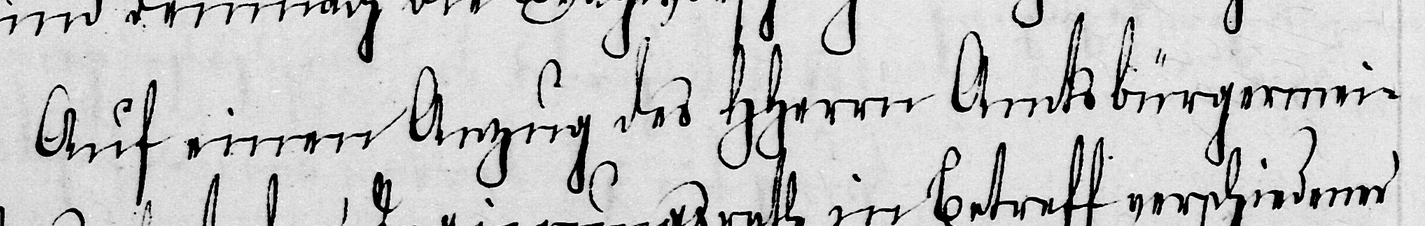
Auf einen Anzug des HHerrn Amtsbürgermei¬
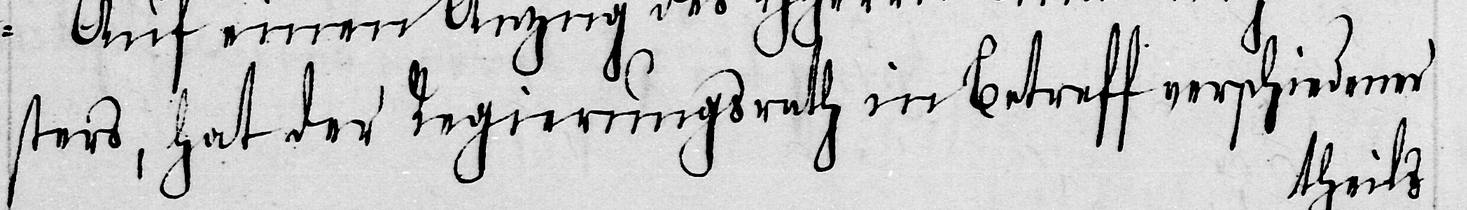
sters, hat der Regierungsrath in Betreff verschiedener
